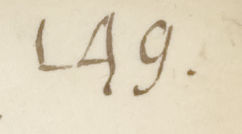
149.
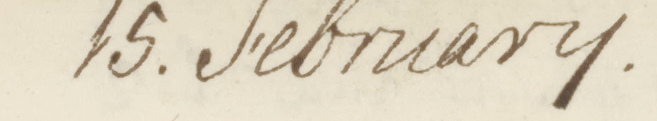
15. February.
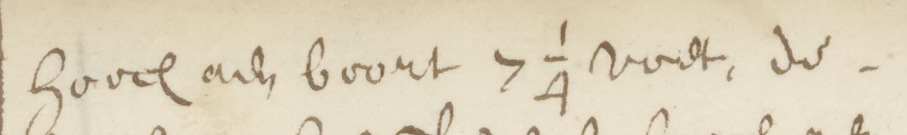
hooch aen boort 7¼ voet, de
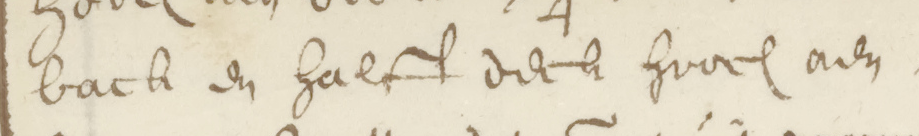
back en halff deck hooch aen
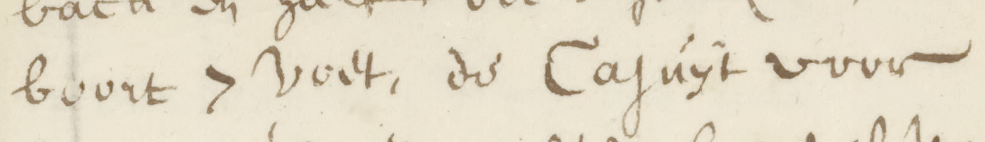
boort 7 voet, de Cajuijt voor
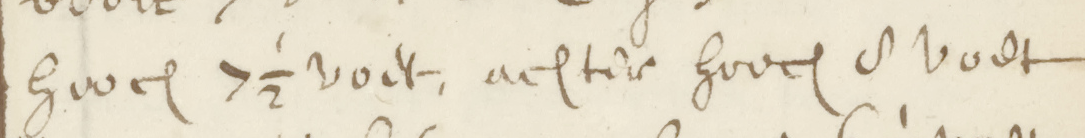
hooch 7½ voet, achter hooch 8 voet
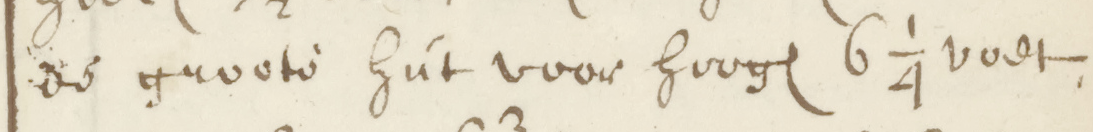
de groote hut voor hoogh 6¼ voet
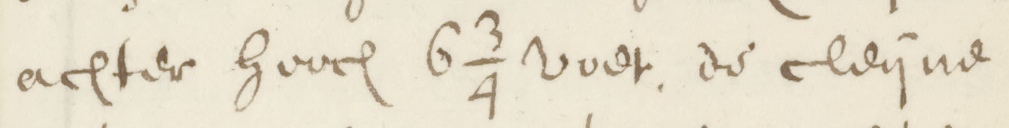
achter hooch 6¾ voet, de cleijne
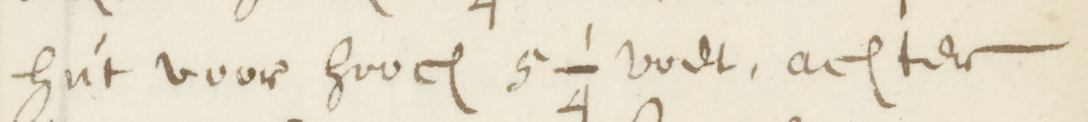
hut voor hooch 5¼ voet, achter
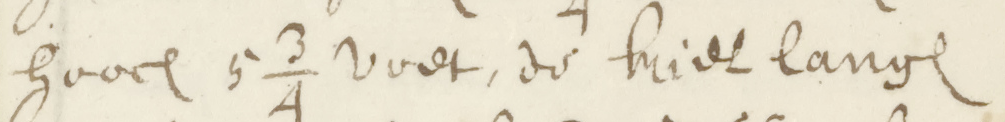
hooch 5¾ voet, de kiel langh
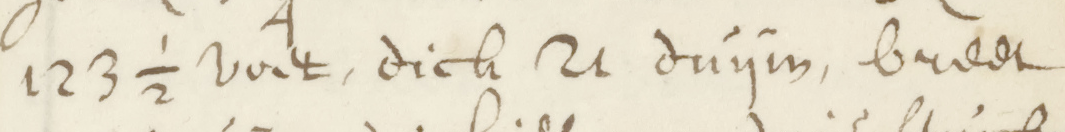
123½ voet, dick 21 duijm, breet
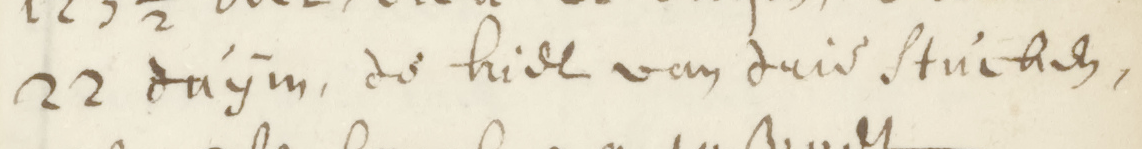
22 duijm, de kiel van drie stucken,
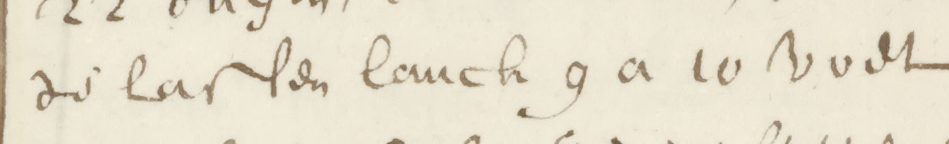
de lassen lanck 9 a 10 voet
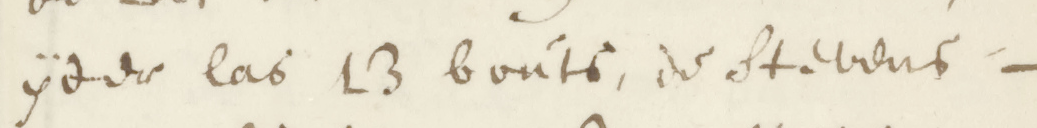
ijder las 13 bouts, de stevens
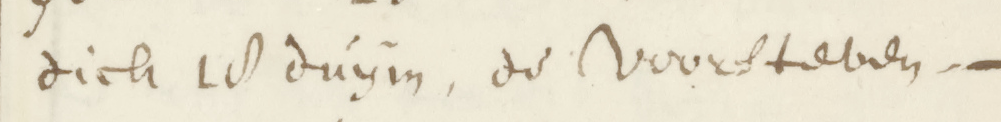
dick 18 duijm, de voorsteven
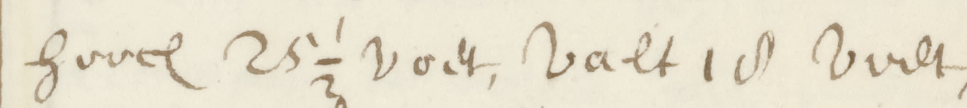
hooch 25½ voet, valt 18 voet,
